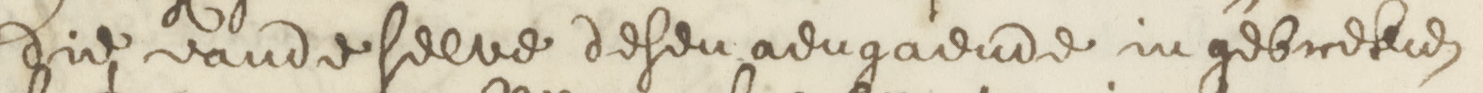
die vande selve desen aengaende in gebreken
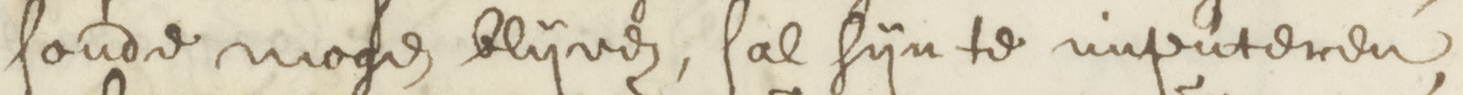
soude mogen blijven, sal sijn te imputeren,
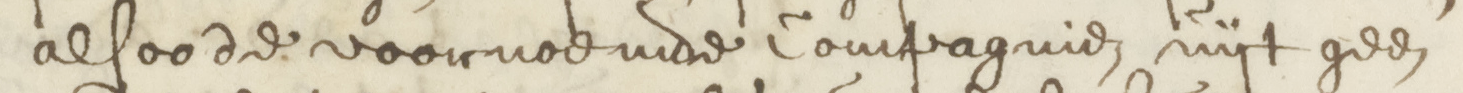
alsoo de voornoemde Compagnien uijt geen
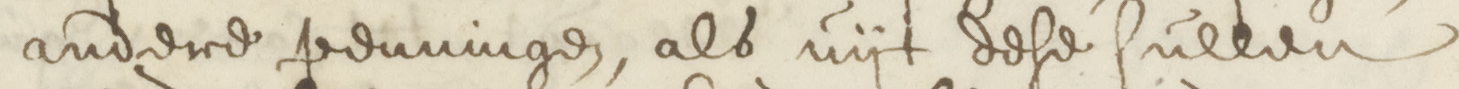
andere penningen, als uijt dese sullen
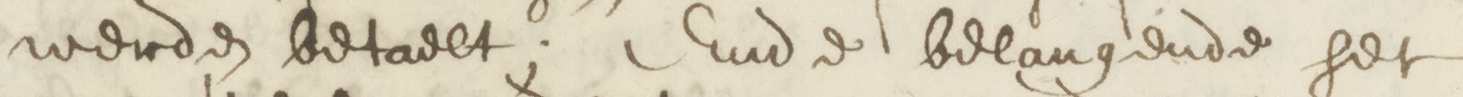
werden betaelt; Ende belangende het
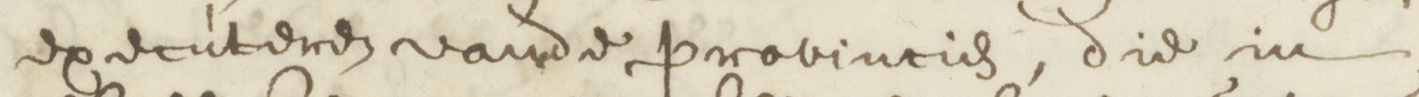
executeren vande provincien, die in
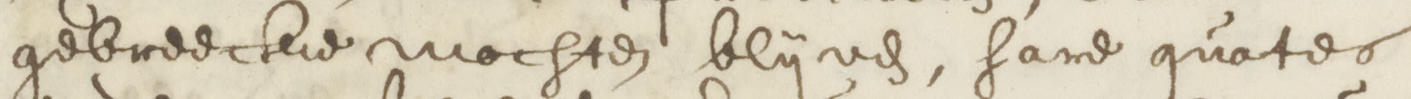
gebreecke mochten blijven, hare quotes
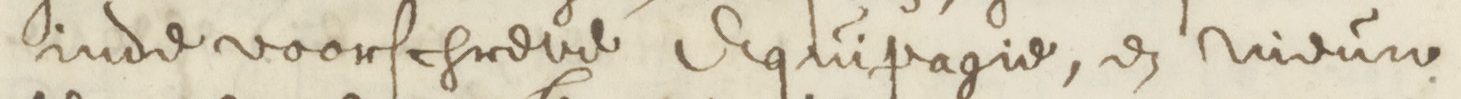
inde voorschreve Equipagie, en nieuw
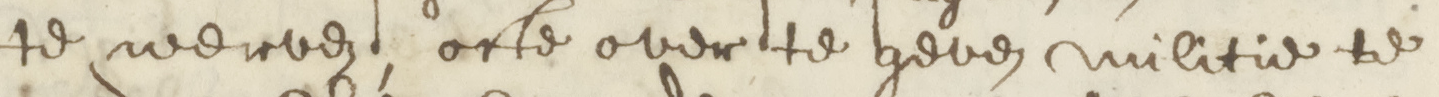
te werven ofte over te geven militie te
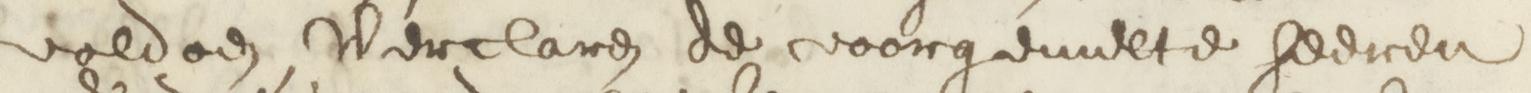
voldoen, Verclaren de voorgemelte heeren
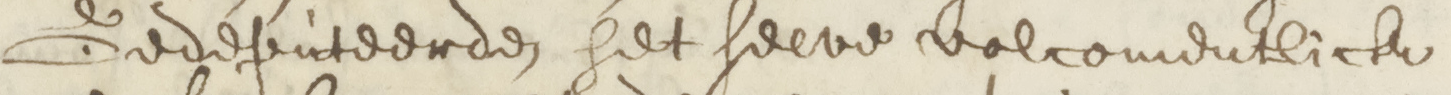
Gedeputeerden het selve volcomentlick
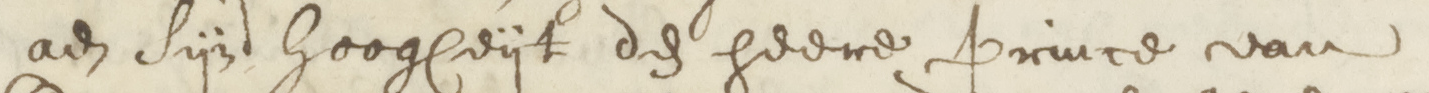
aen Sijn Hoogheijt den heere Prince van
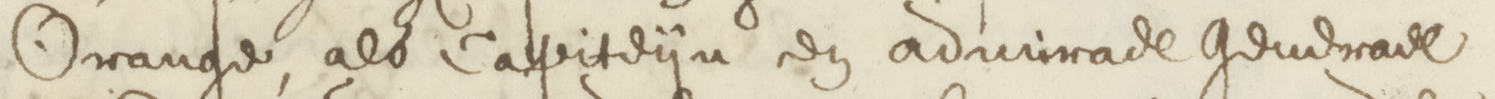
Orange, als Capiteijn en admirael Generael
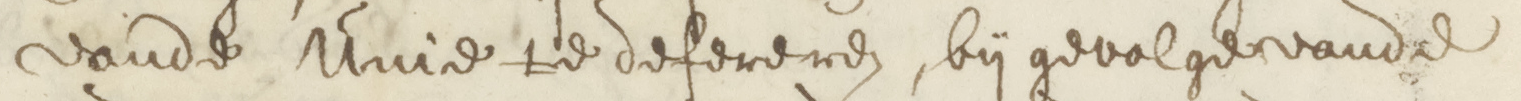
vande Unie te defereren, bij gevolge vande
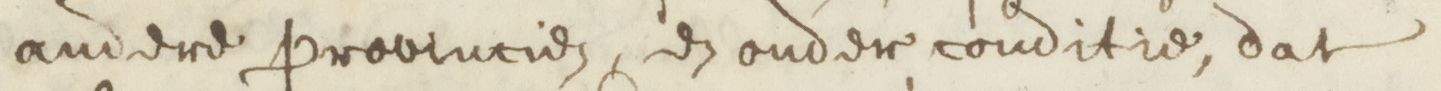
andere provincien, en onder conditie, dat
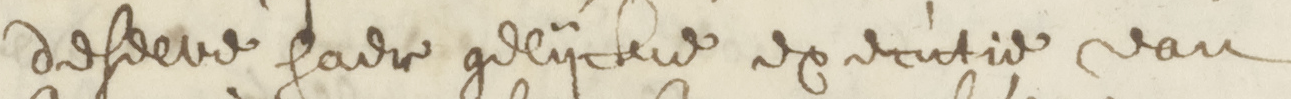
deselve haer gelijcke executie van
